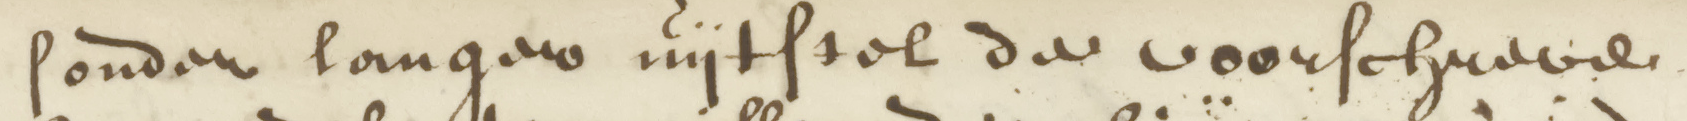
sonder langer uijtstel de voorschreve
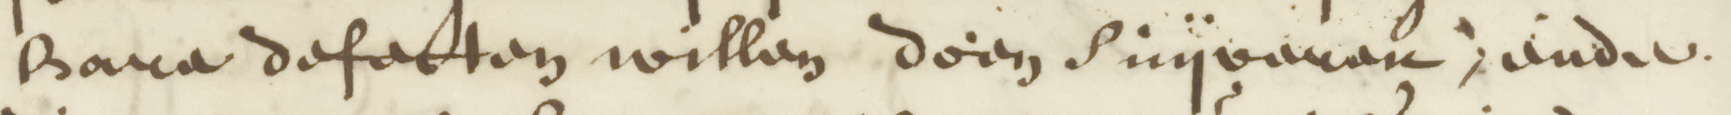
hare defecten willen doen suijveren, ende
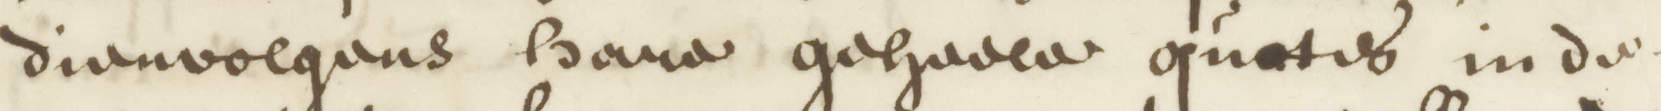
dienvolgens hare geheele quotes in de
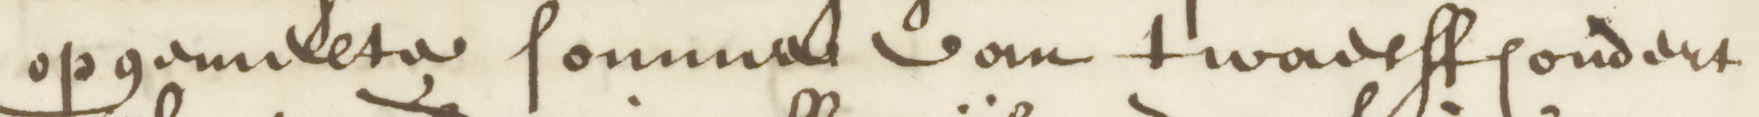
opgemelte somme van twaelffhondert
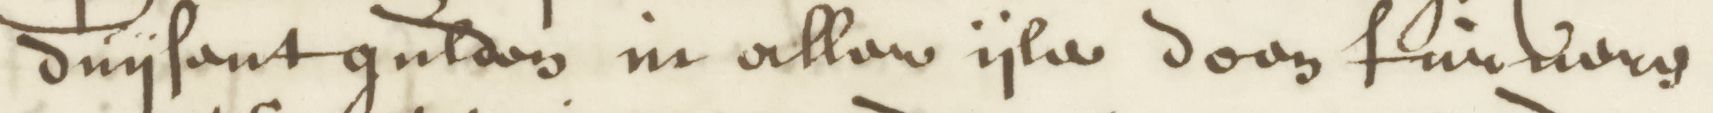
duijsent gulden in aller ijle doen furneren
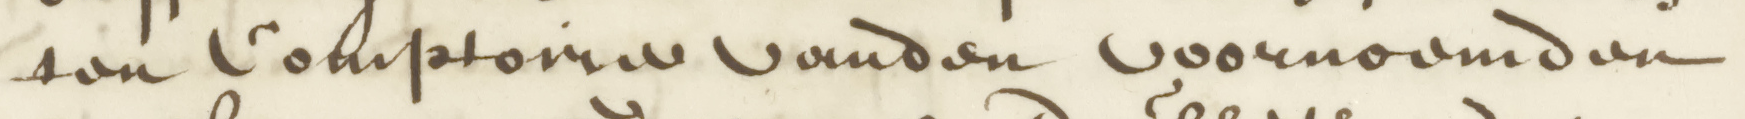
ten Comptoire vanden voornoemden
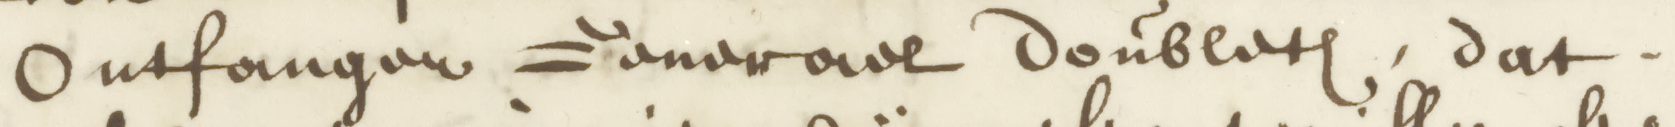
Ontfanger Generael Doubleth, dat
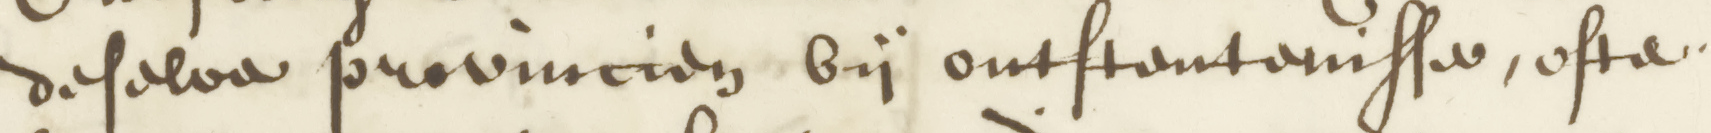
deselve provincien bij ontstentenisse, ofte
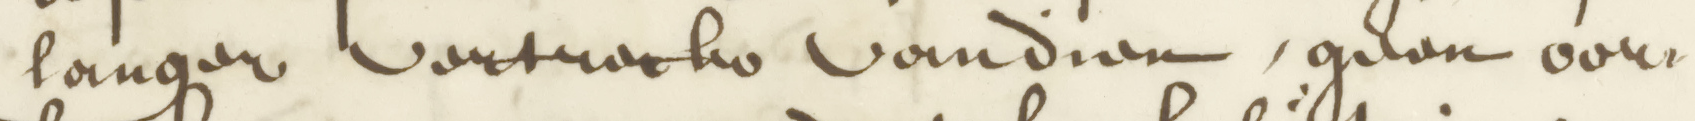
langer vertreck vandien, geen oor„
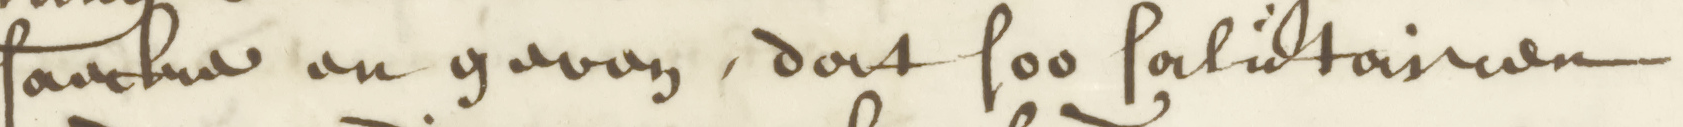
,,saecke en geven, dat soo salutairen
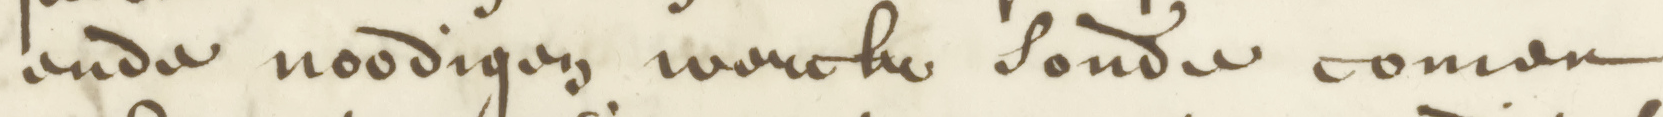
ende noodigen werck soude comen
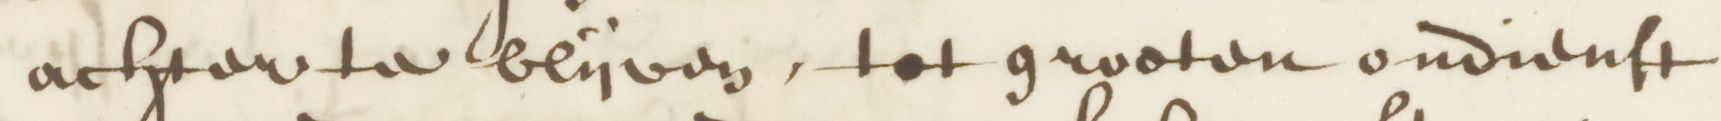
achter te blijven, tot grooten ondienst
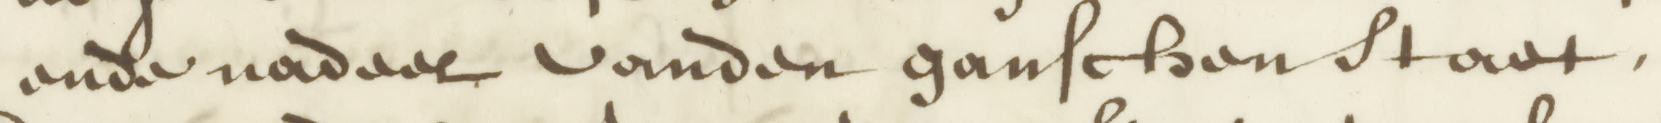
ende nadeel vanden ganschen Staet.
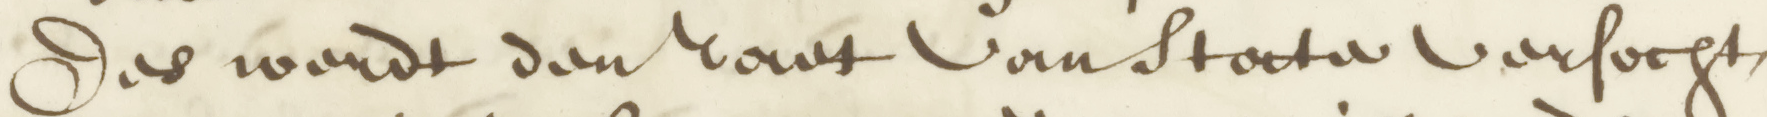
Des werdt den Raet van State versocht
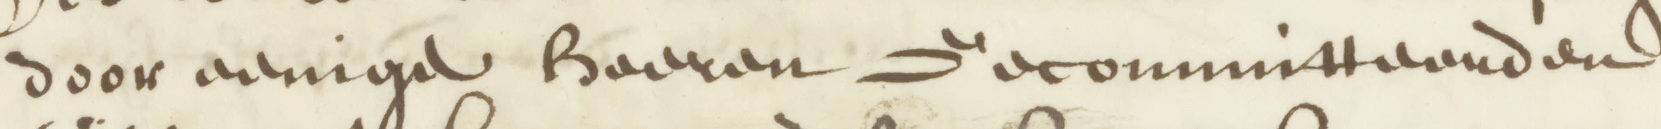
door eenige heeren Gecommitteerden
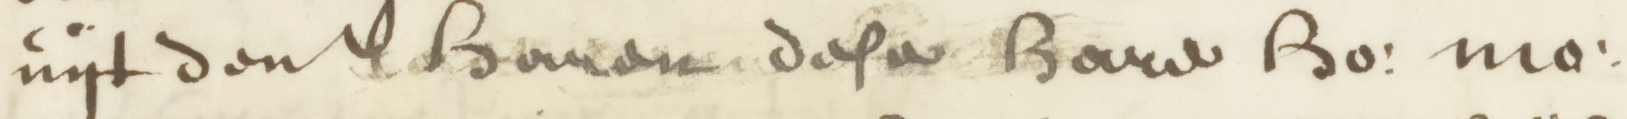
uijt den r haren, dese hare Ho:Mo:
